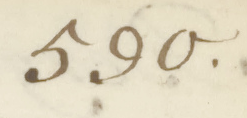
590
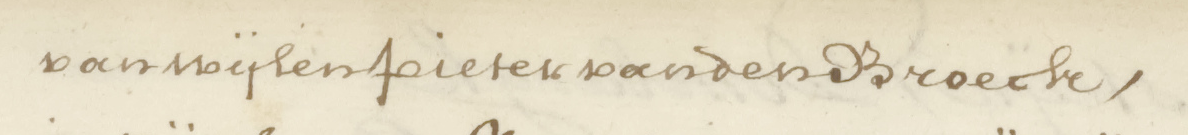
van wijlen Pieter vanden Broeck,
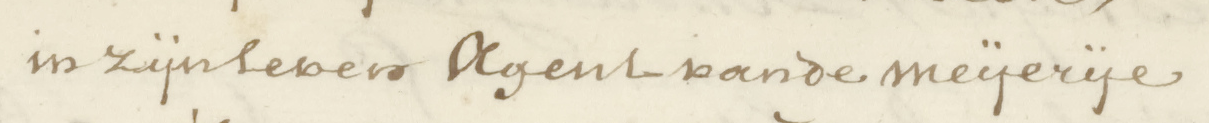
in zijn leven agent van de Meijerije
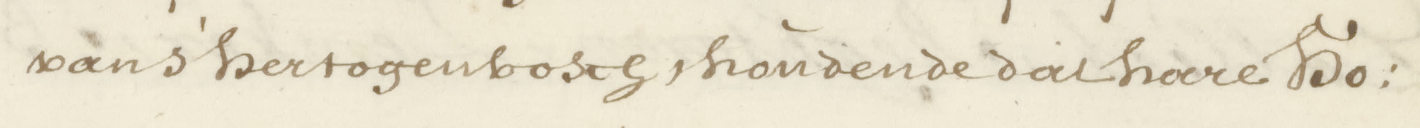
van s'Hertogenbosch, houdende al haere Ho:
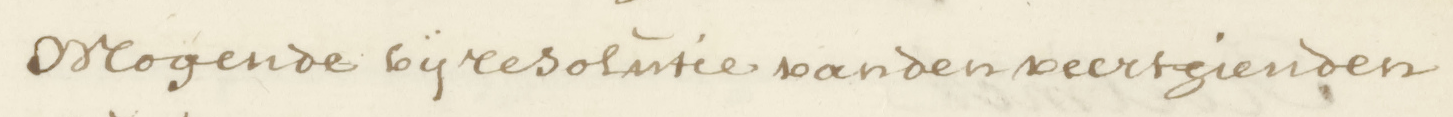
Mogende bij resolutie van den veerthienden
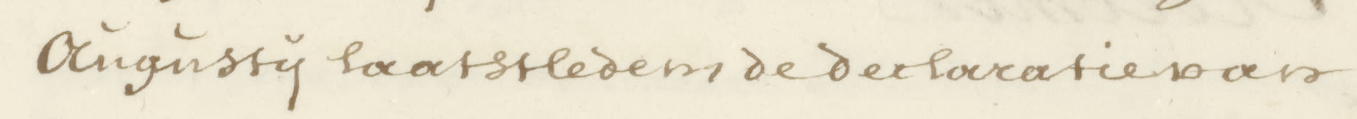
Augustij laatstleden de declaratie van
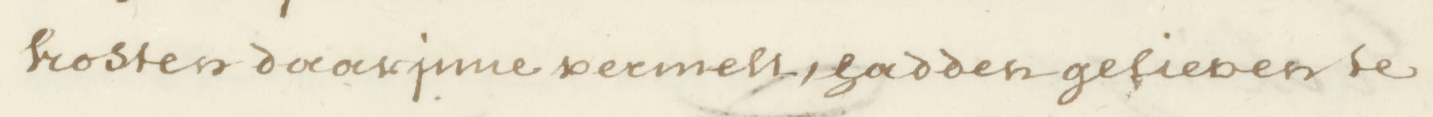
kosten daarinne vermelt, hadden gelieven te
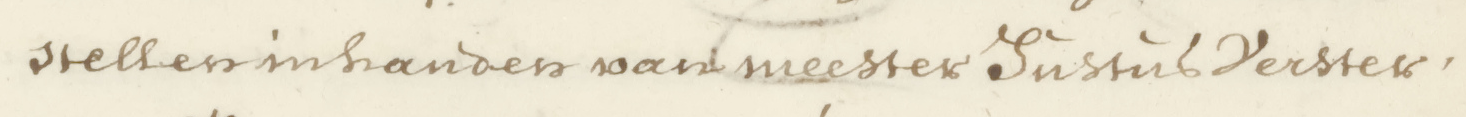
stellen in handen van meester Justus Verster,
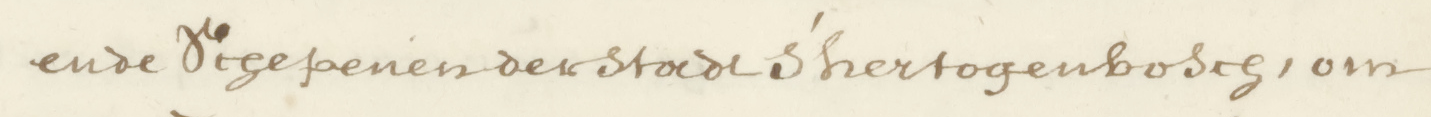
ende Schepenen der stadt s'Hertogenbosch, om
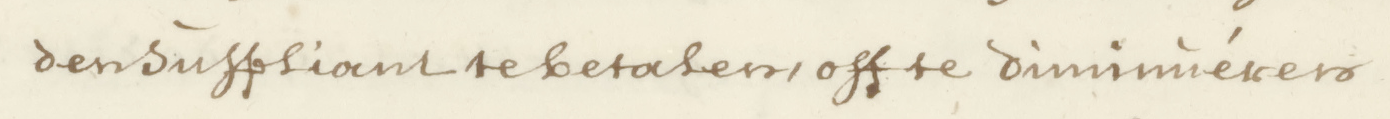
den suppliant te betalen, off te diminueren
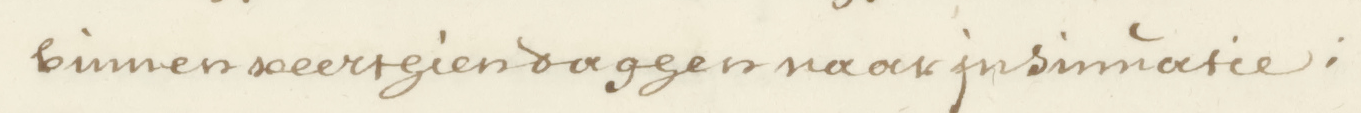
binnen veertien daghen naar insinuatie:
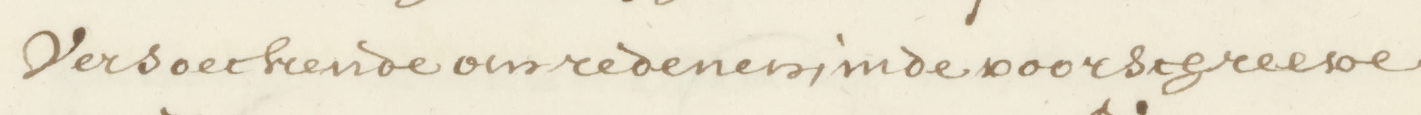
Versoeckende om redenen, in de voorschreeve
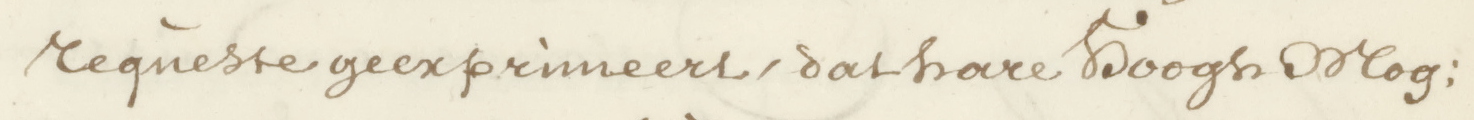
requeste geexprimeert, dat hare Hoogh Mog:
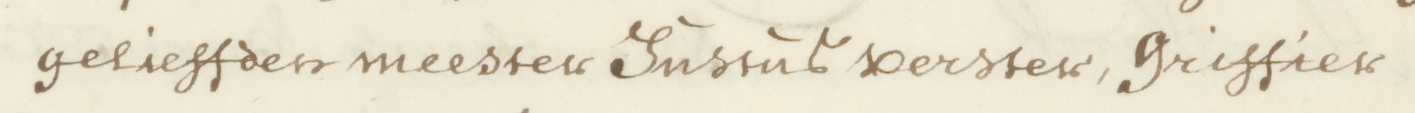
gelieffden meester Justus Verster, griffier
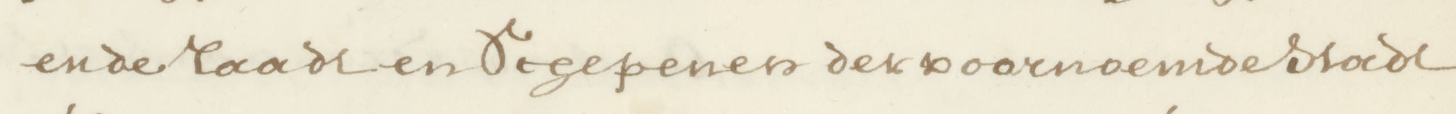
ende raadt en Schepenen der voornoemde stadt
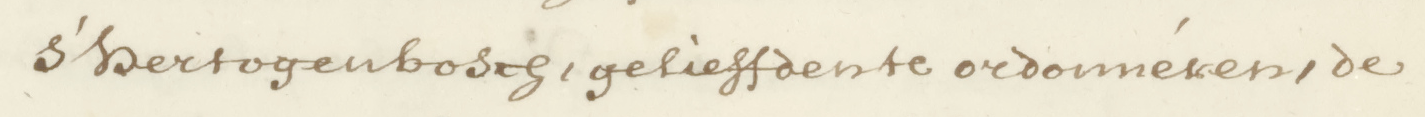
s'Hertogenbosch, gelieffden te ordonneren, de
